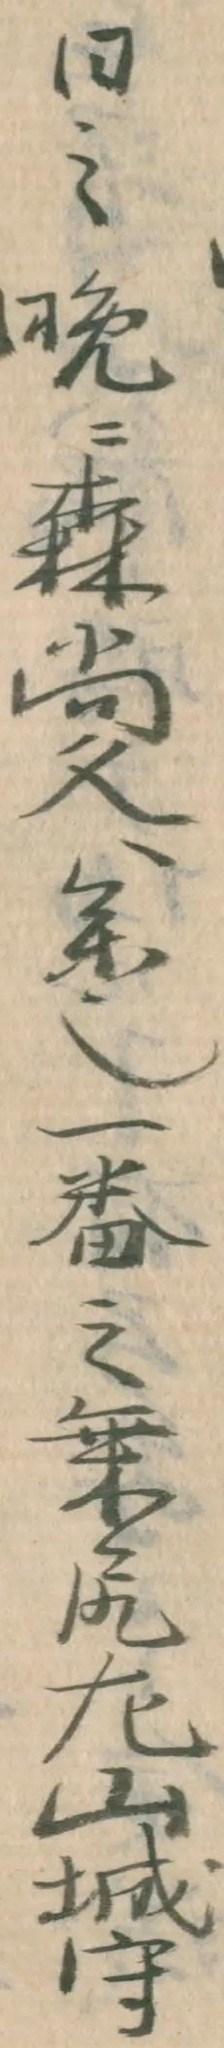日之晩ニ森尚父へ参也一番之乗尻左山城守
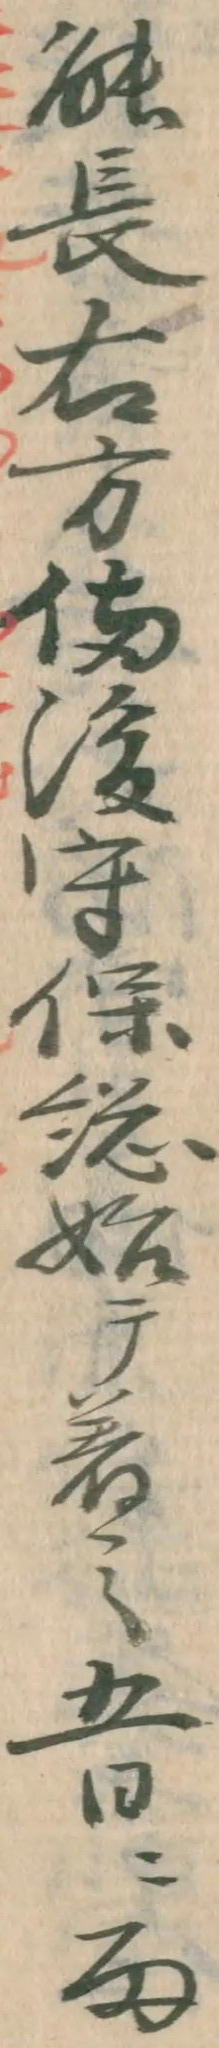能長右方備後守保総始テ着之五日ニ雨
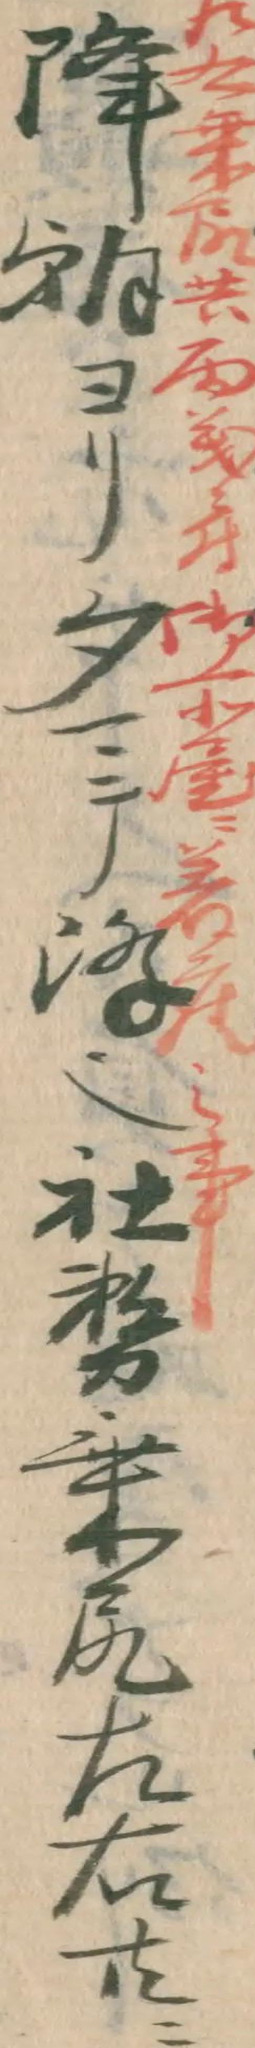降朝ヨリ夕マテ降也社務乗尻左右共ニ
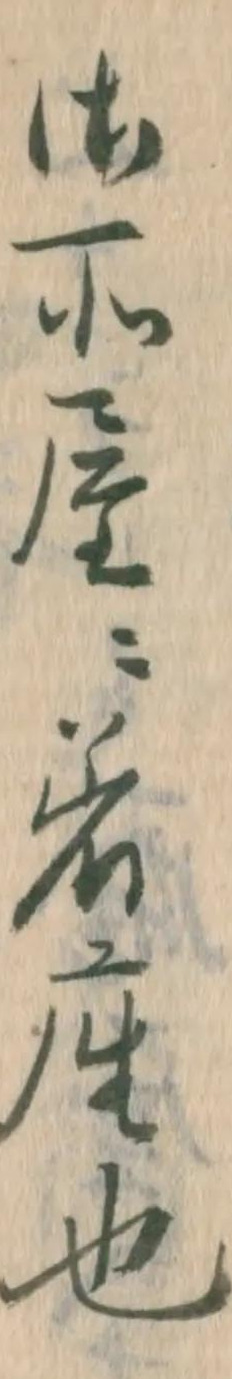御所屋二着座也
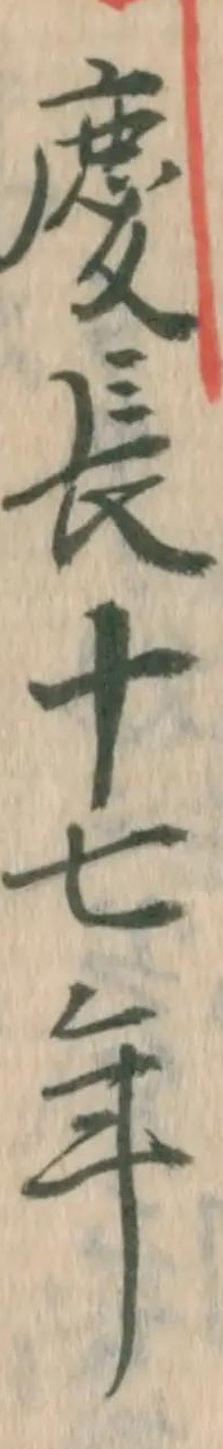慶長十七年
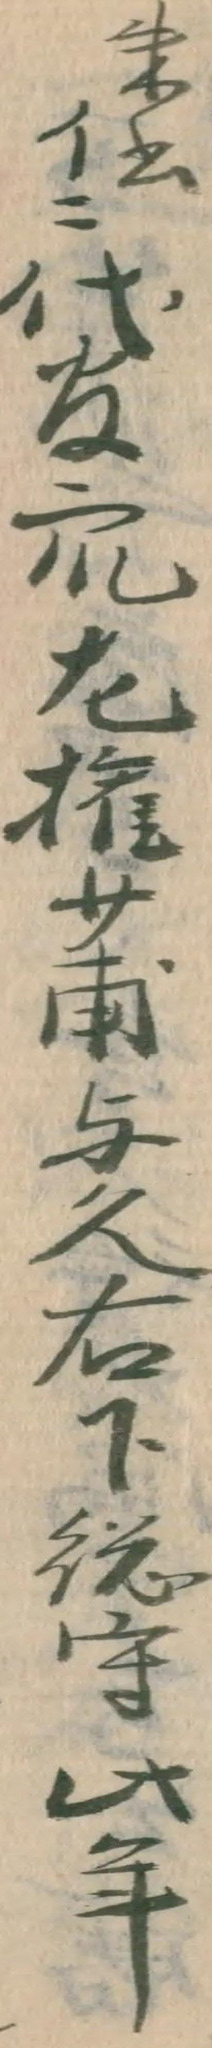イニ代官衆左権少輔与久右下総守此年
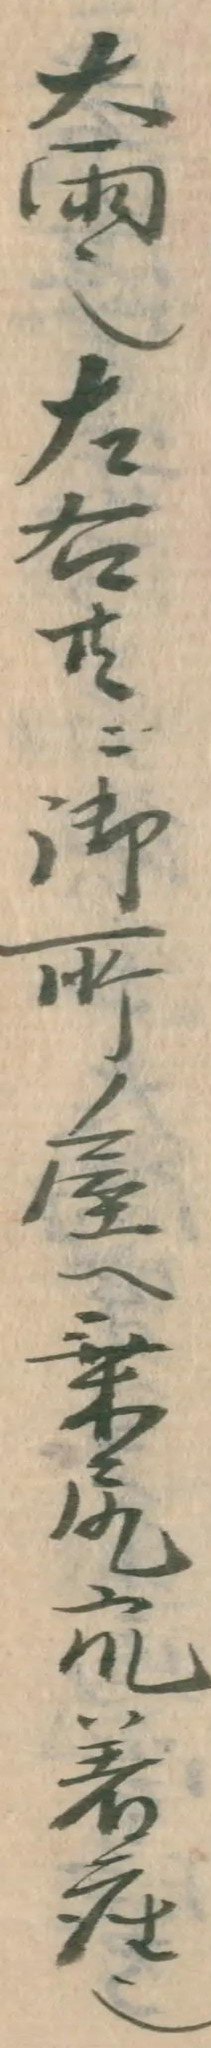大雨也左右共ニ御所ノ屋へ乗尻衆着座也
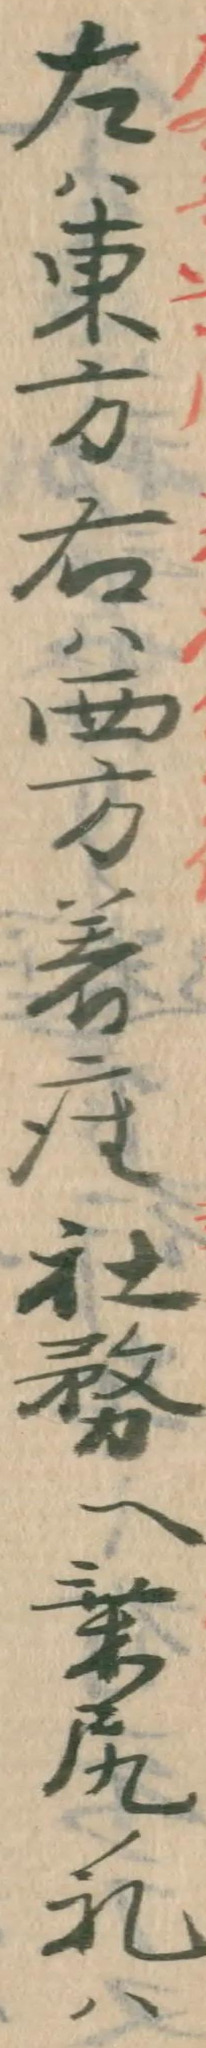左ハ東方右ハ西方着座社務ヘ乗尻ノ礼ハ
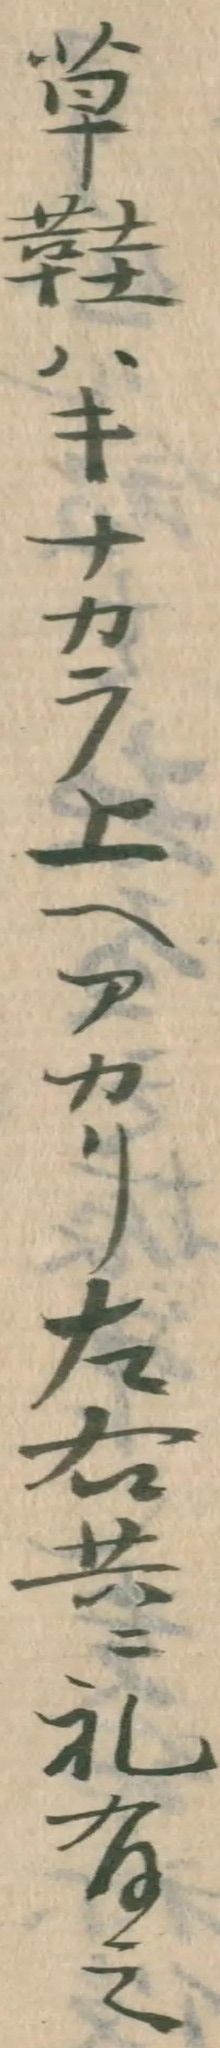草鞋ハキナカラ上ヘアカリ左右共ニ礼有之
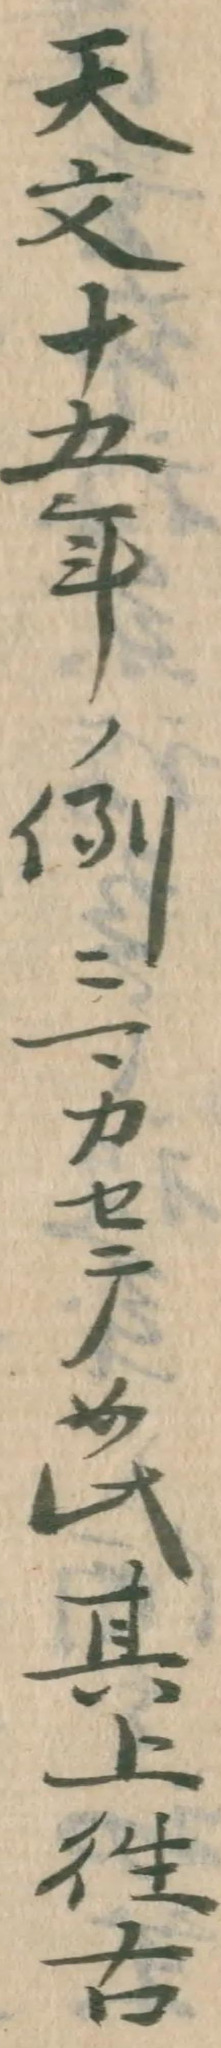天文十五年ノ例ニマカセテ如此其上往古
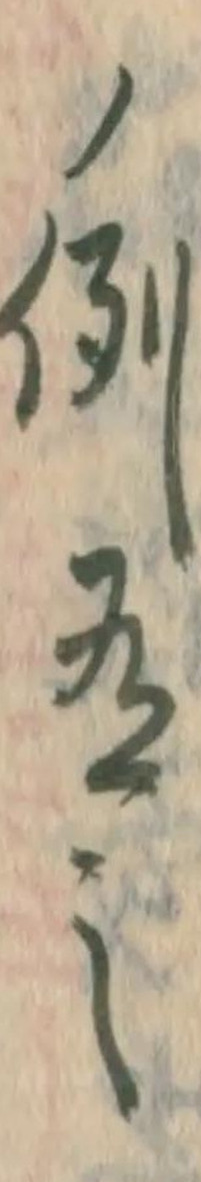ノ例有之
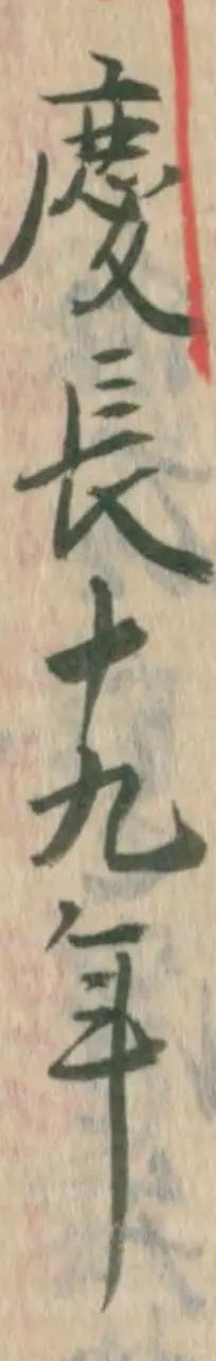慶長十九年
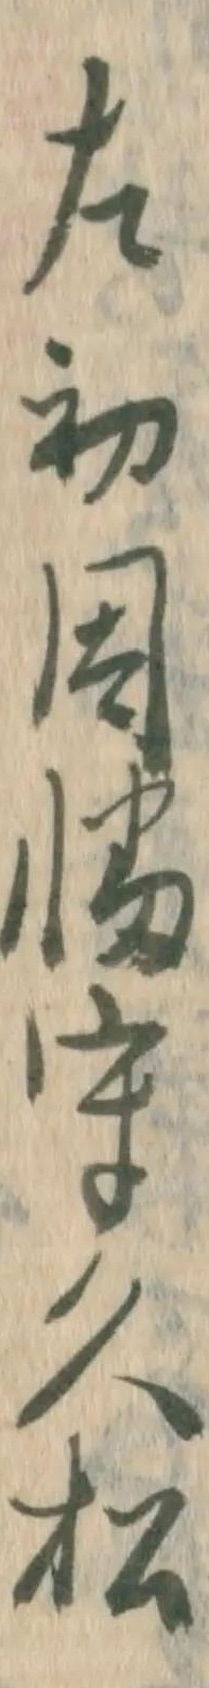左初因幡守久松
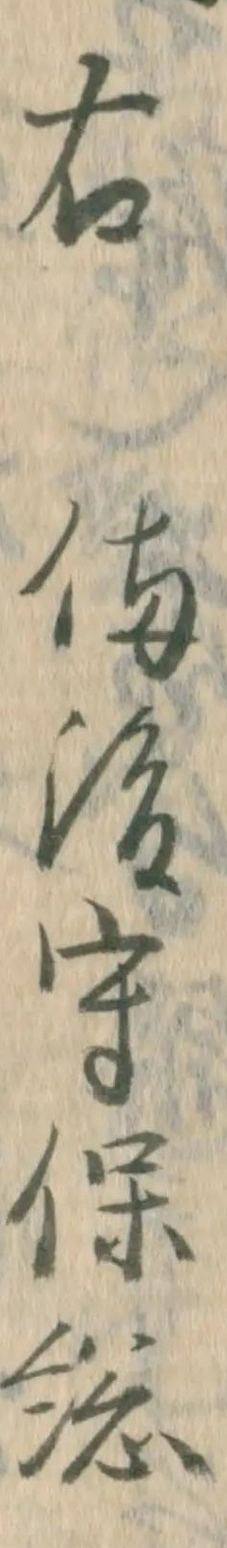右備後守保総
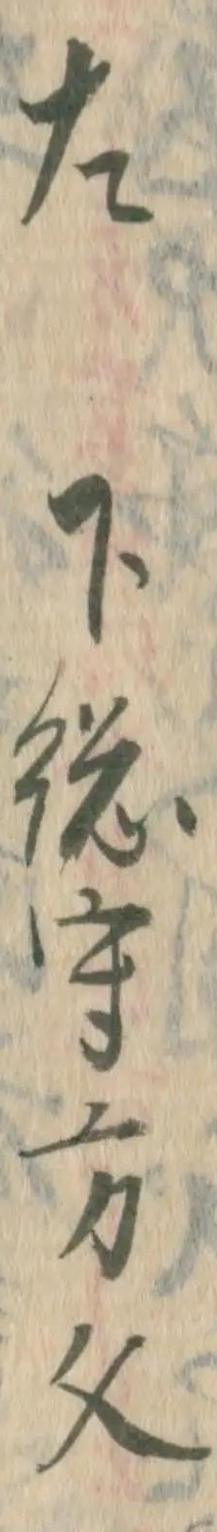左下総守方久

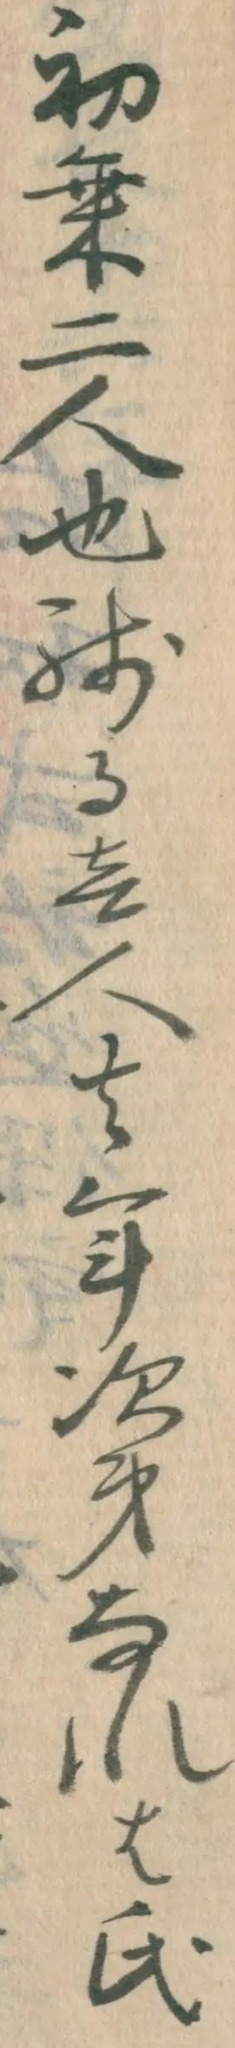初乗二人也残る壱人は年次第なれは氏
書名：賀茂社記録. 第10冊
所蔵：国立国会図書館 National Diet Library, JAPAN
